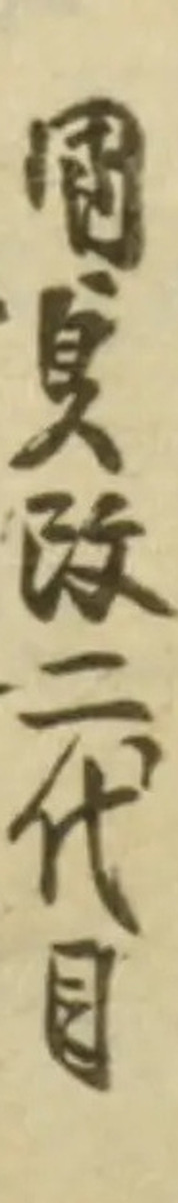国貞改二代目
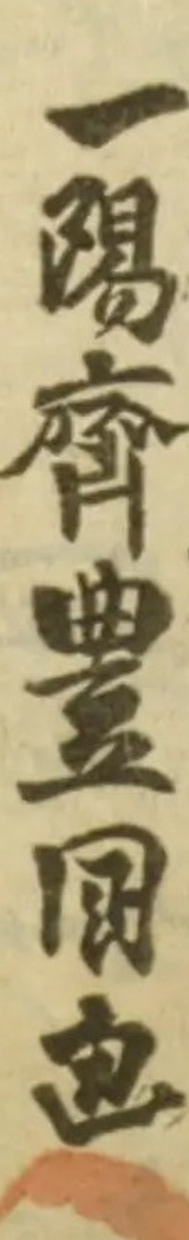一陽斎豊国画
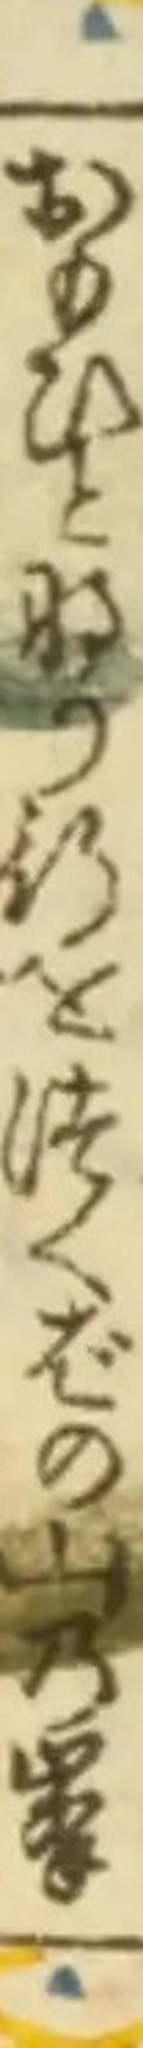おもひとなり行をつくばの山の峯
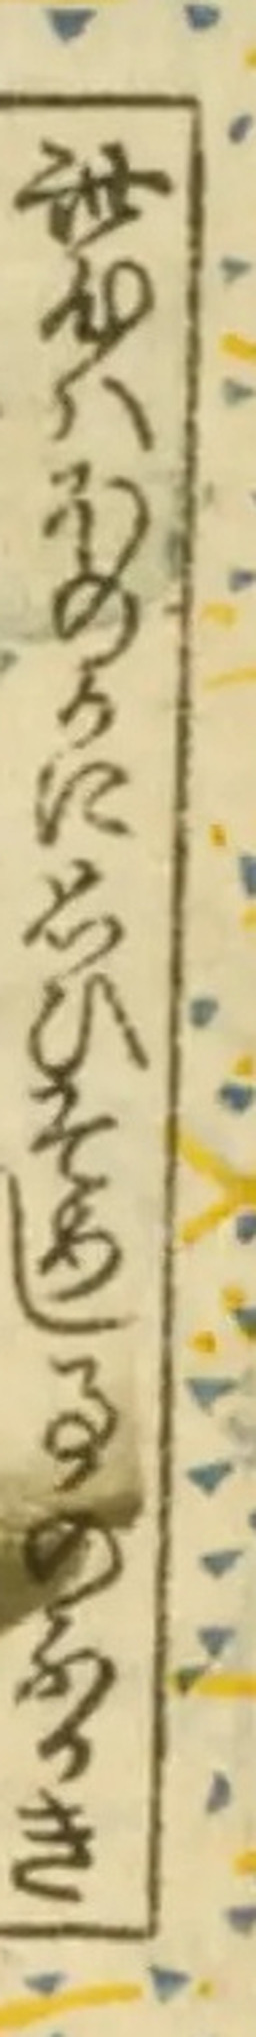此心はほのかに思ひそめし事のふかき
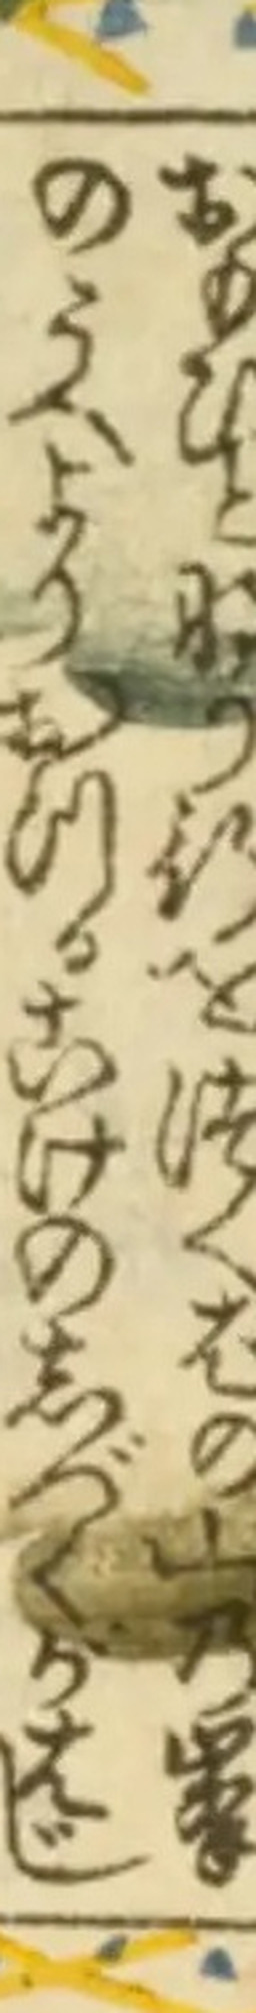のうへよりおつるこけのしづくがはじ
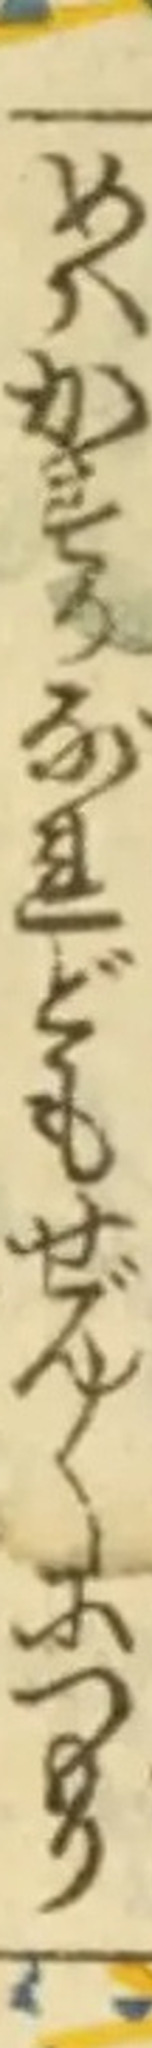めはかすかなれどもぜん〳〵につもり
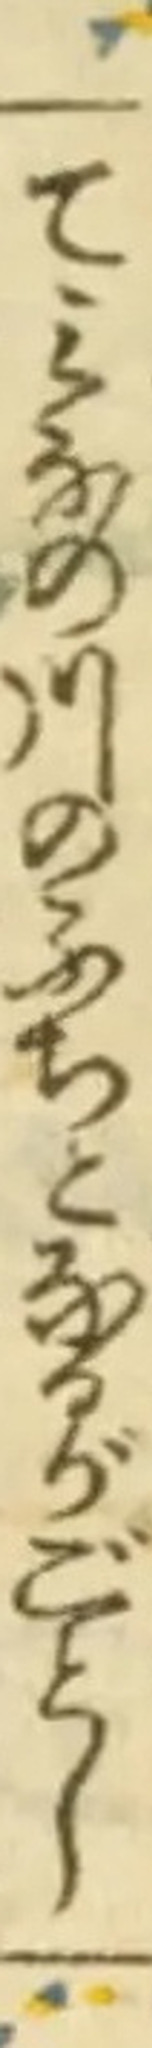てみなの川のふちとなるがごとし
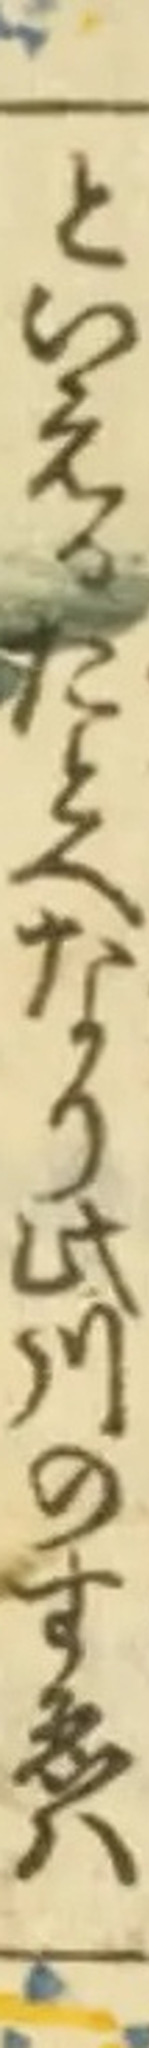といえるたとへなり此川のすゑは
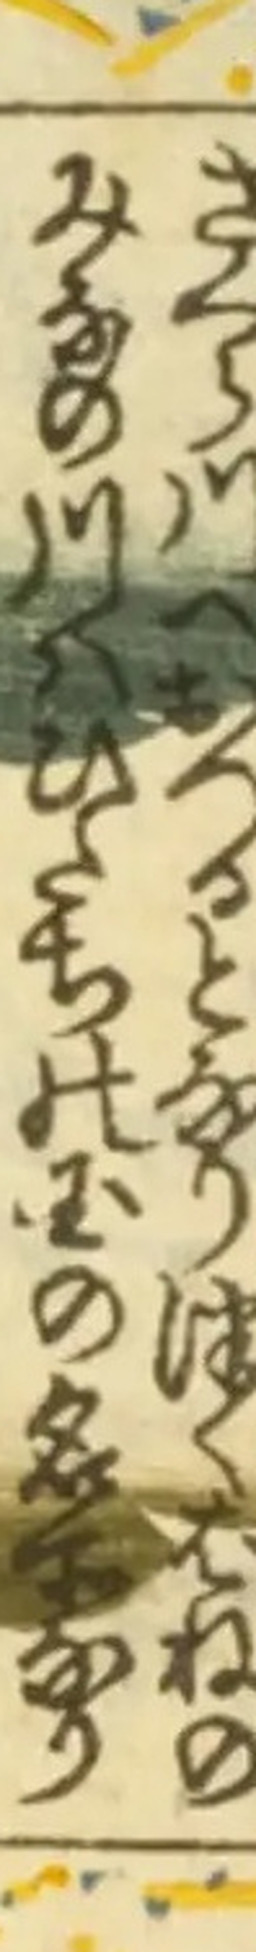みなの川はひたちの国の名所なり
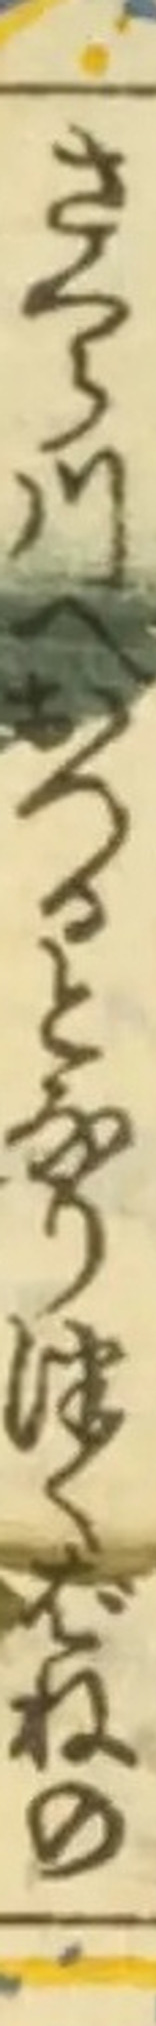さくら川へおつるとなりつくばねの
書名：百人一首絵抄　十三　陽成院
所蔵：国立国会図書館 National Diet Library, JAPAN
